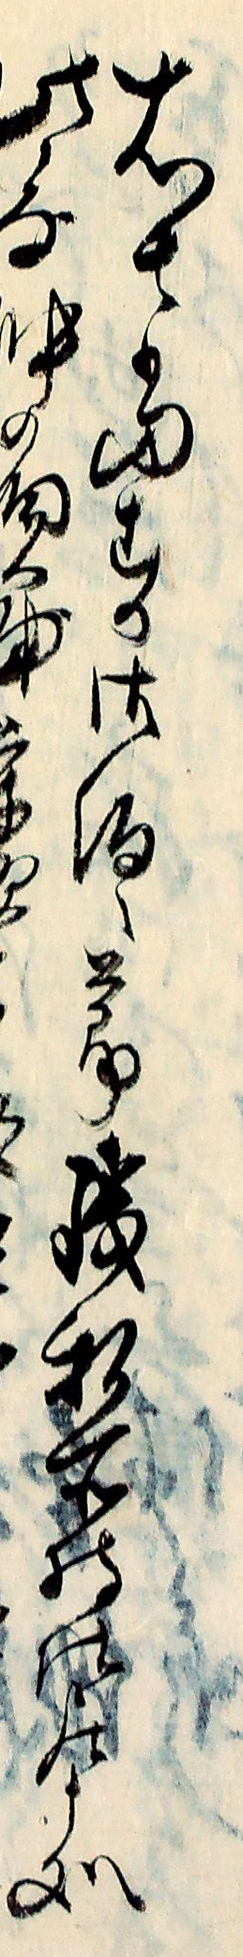右は当春御約之節残私所持仕居申処
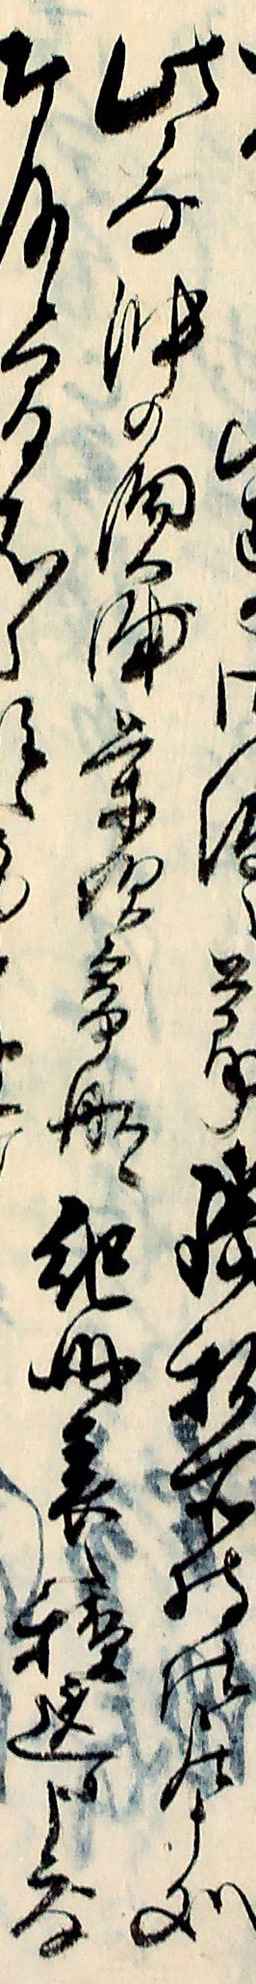此度沖の須浦栄次郎船に紀州表へ積送り申度
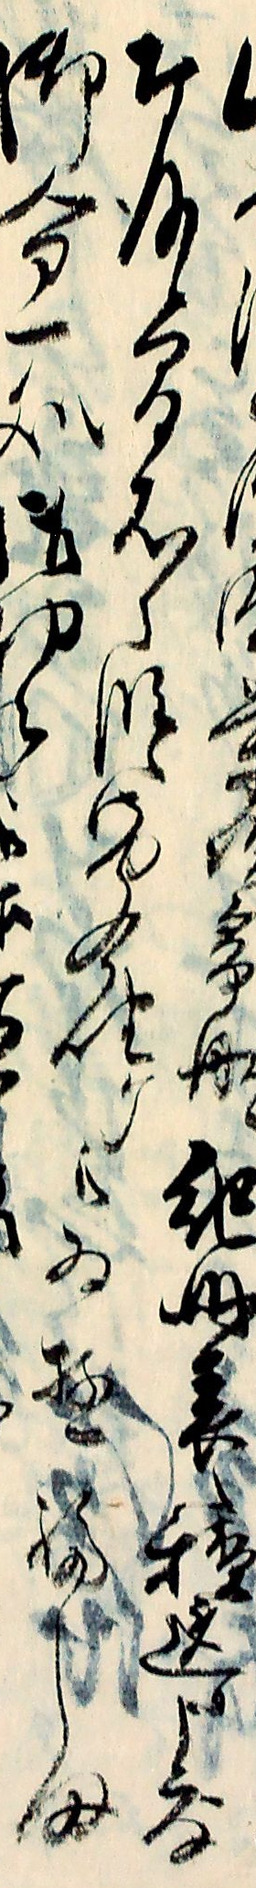奉存候間右之段御聞届け被為遊福しま
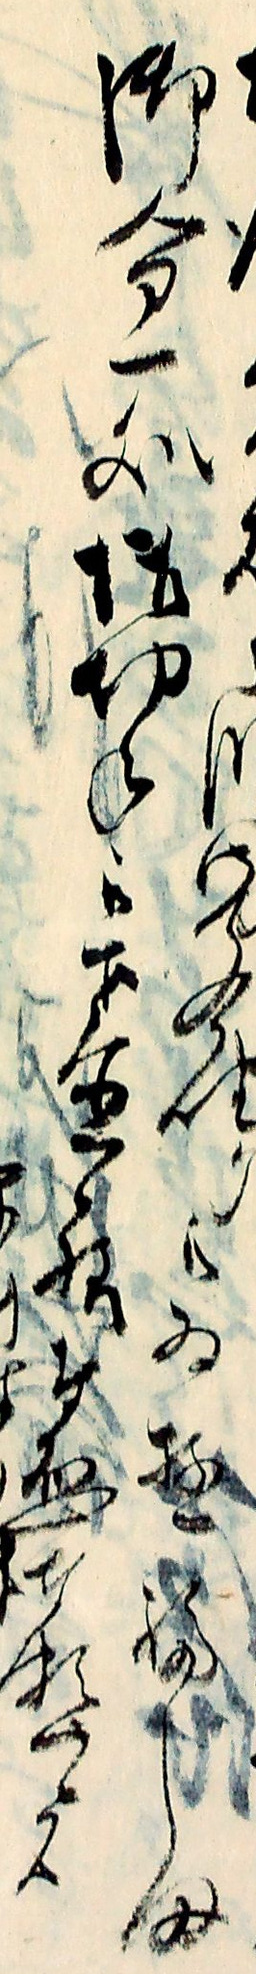御分一処御切手被下置候様奉恐奉願上候以上
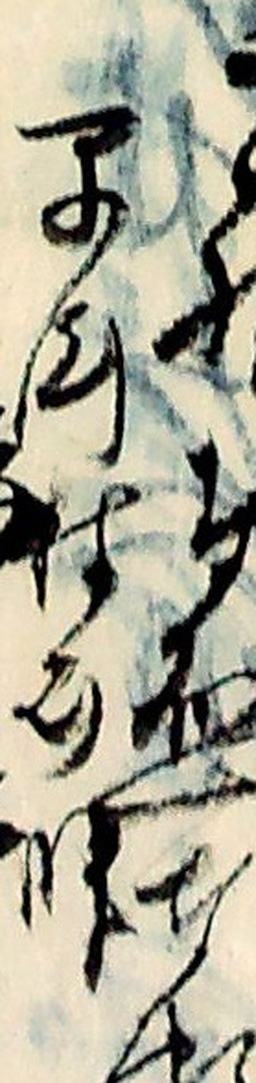早淵村玉師
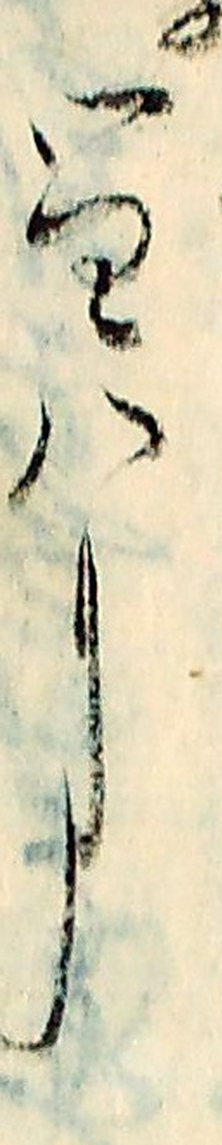閏八月
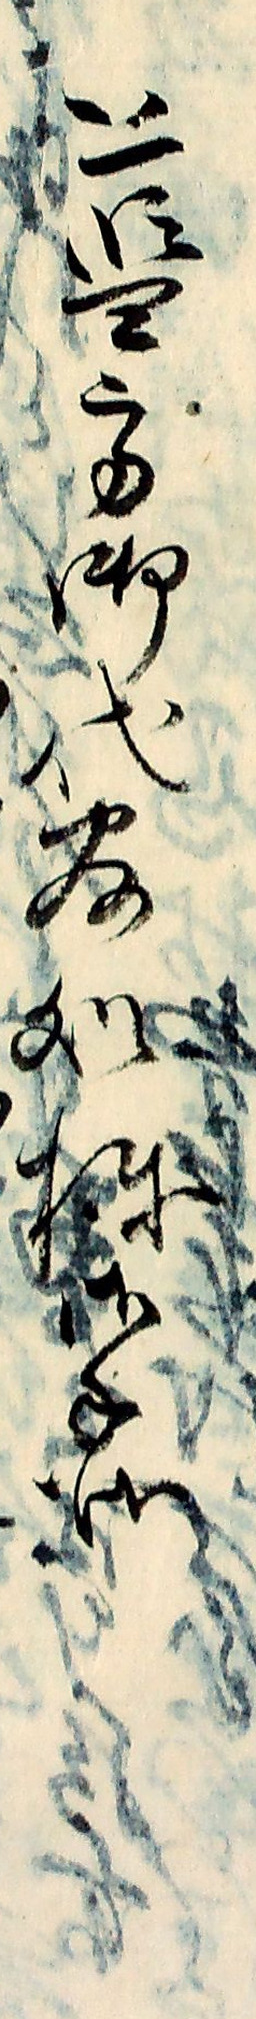藍方御代官処様御手代
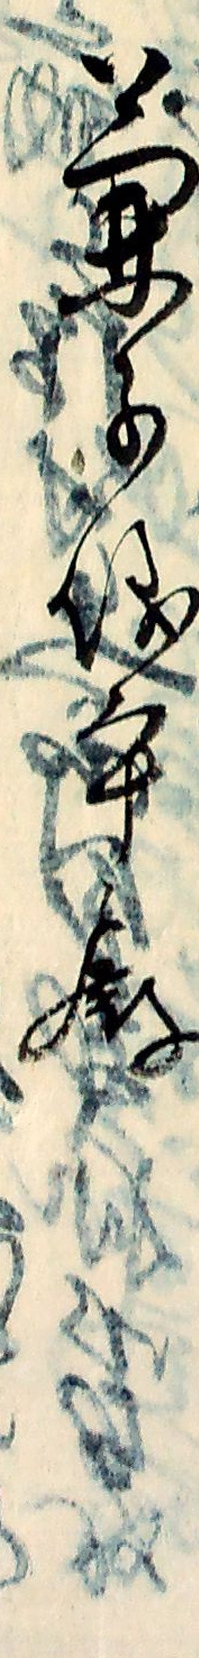兼子儀平殿
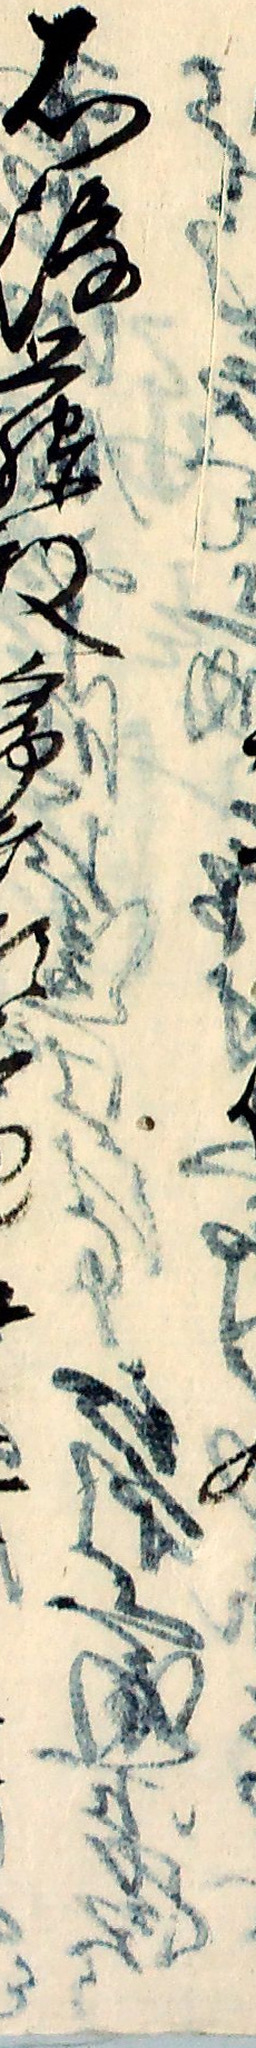子後藤利八郎
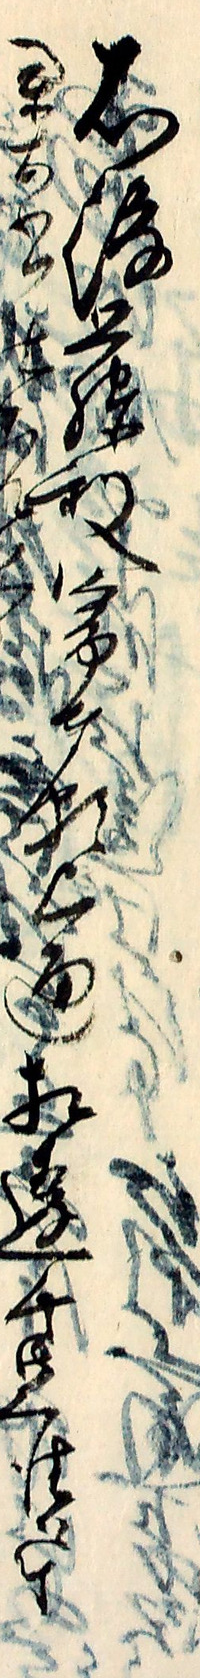右後藤利八郎奉願上通相違無御座候に付
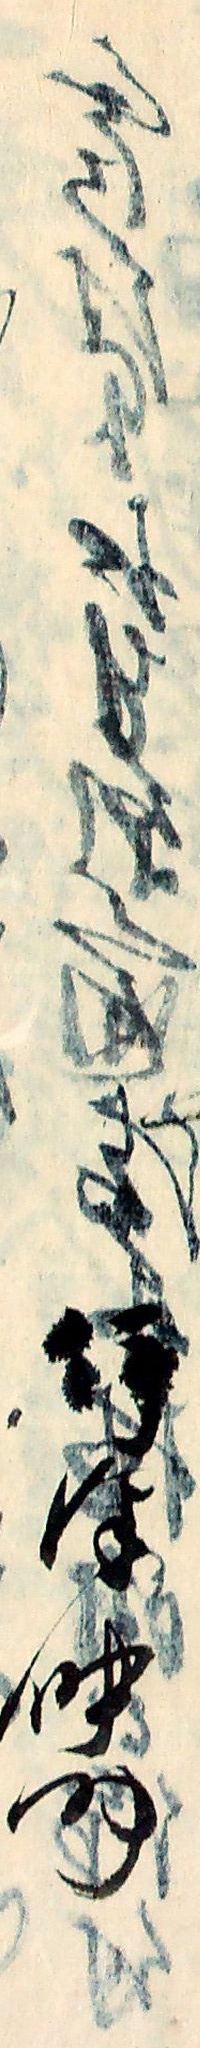伊沢仲助
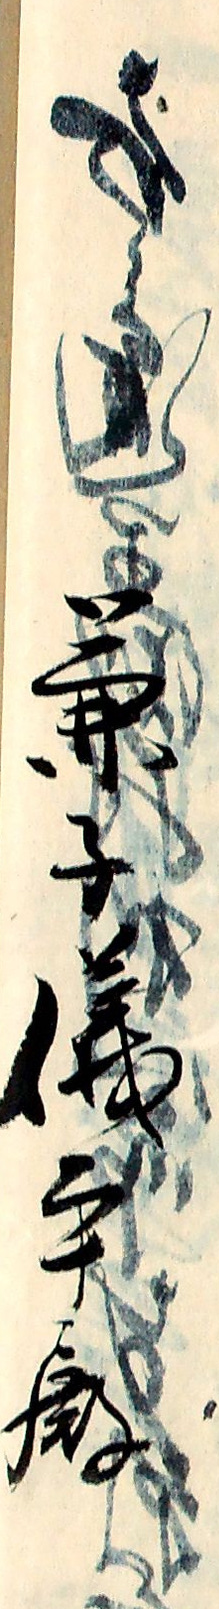兼子儀平殿

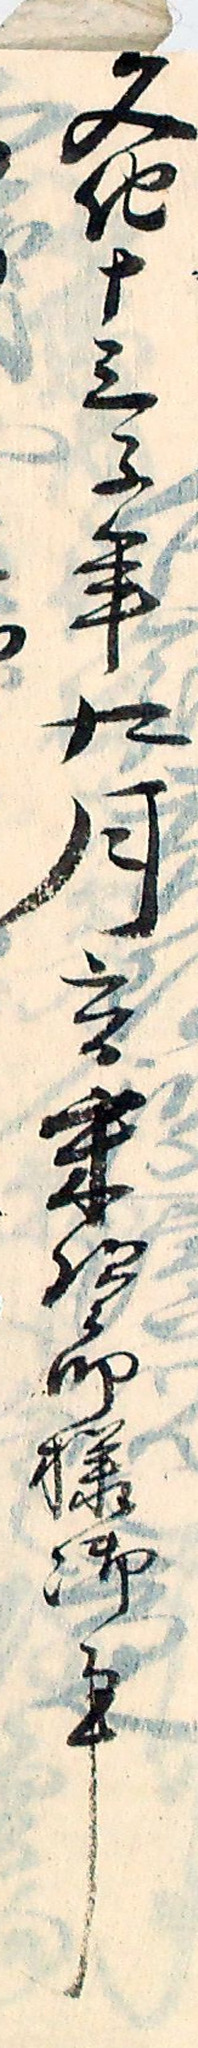文化十三子年九月六日宋次郎様御事
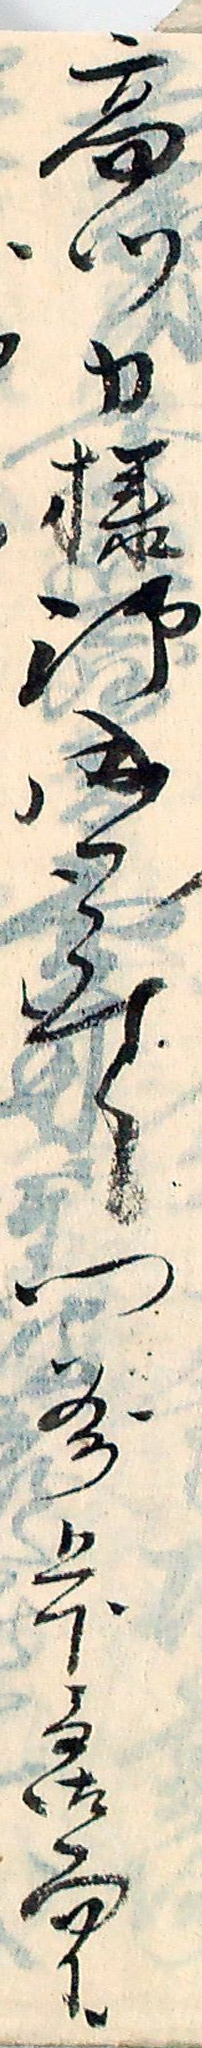高川力様御成御座候門前上下にて御向に
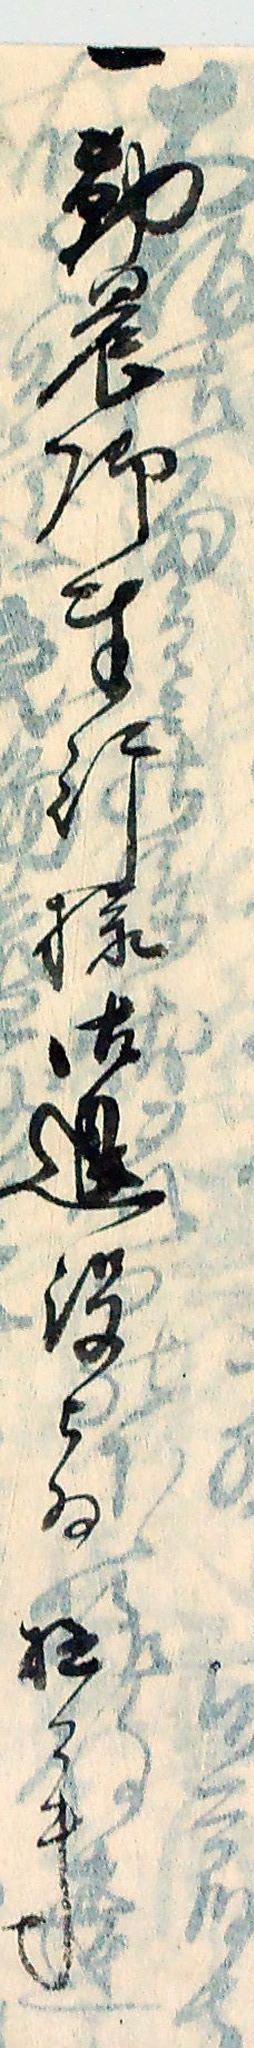一勧農御奉行様御退役被為遊候付
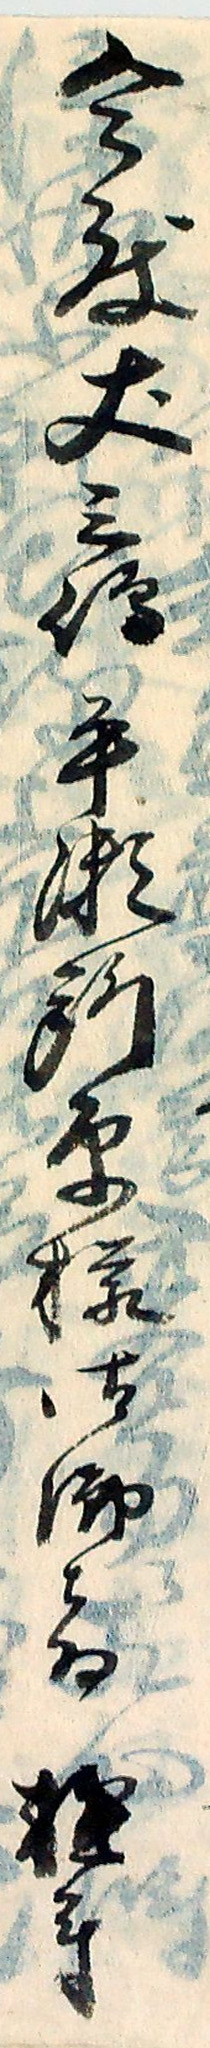今度丈三僧平瀬所平様御働被為遊候付
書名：諸御願書控(後藤氏壱番）
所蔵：鳴門教育大学 Naruto University of Education
